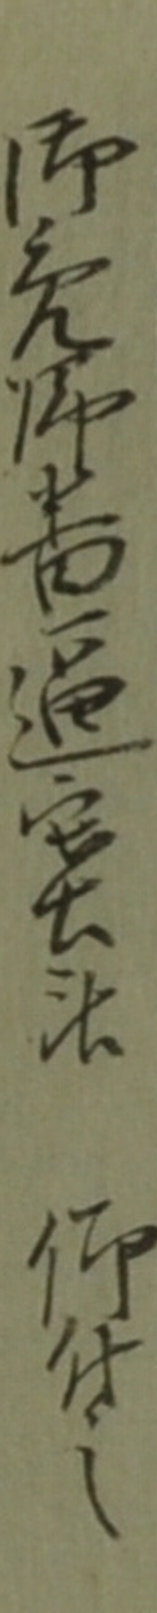御免御番逼塞被仰付之
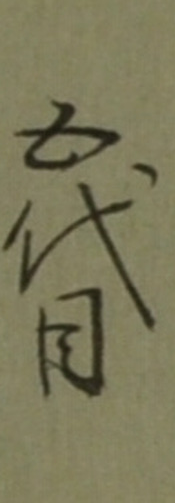五代目
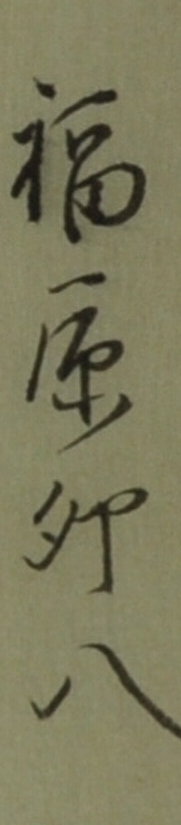福原卯八

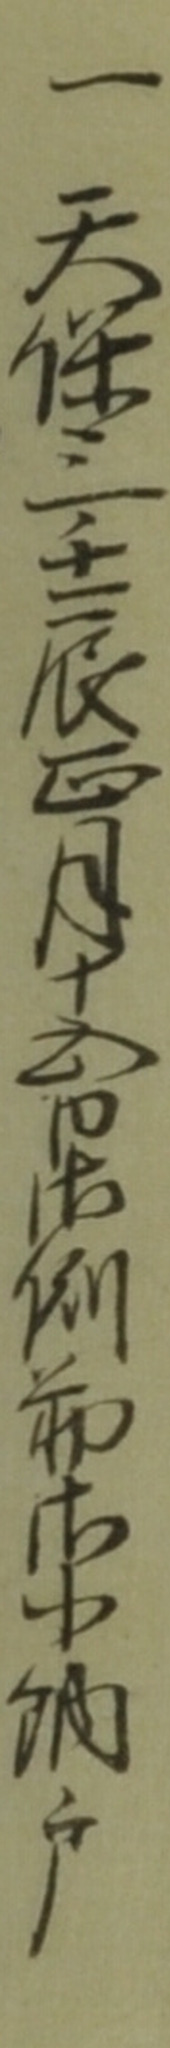一天保三壬辰史料正月十五日御側勤御小納戸
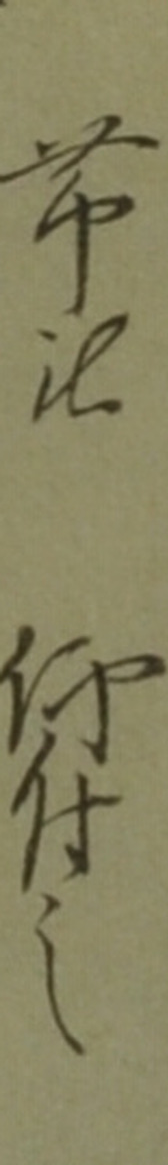帯被仰付之
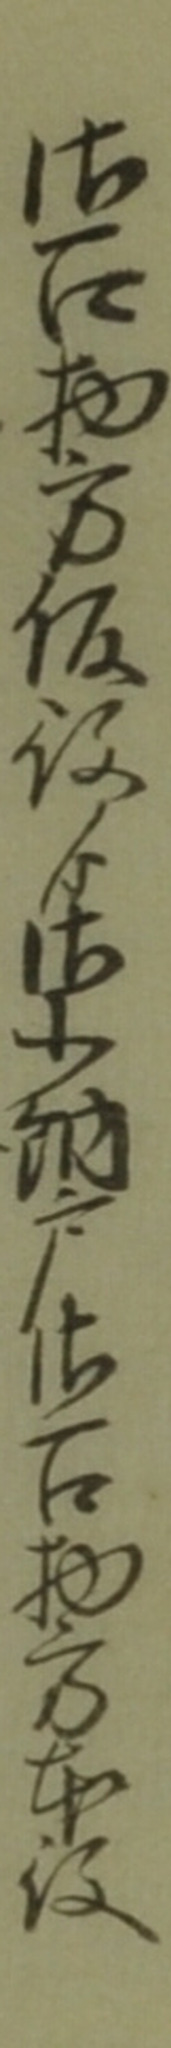御召物方仮役ゟ御小納戸御召物方本役
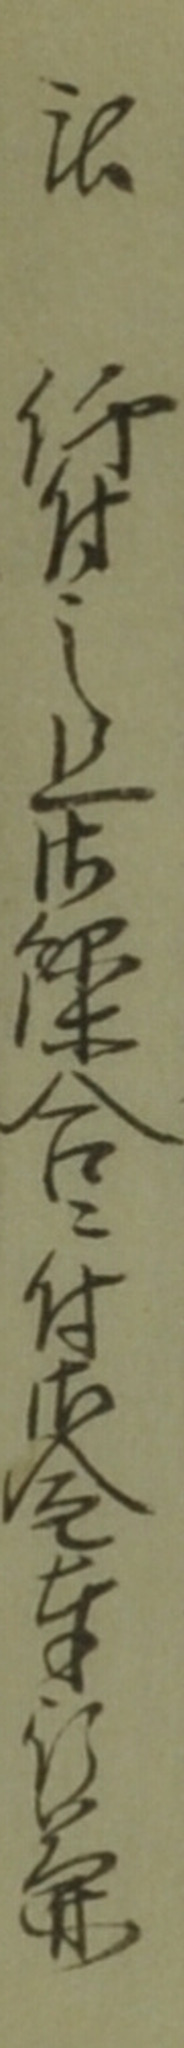被仰付之且御繰合ニ付御金奉行兼
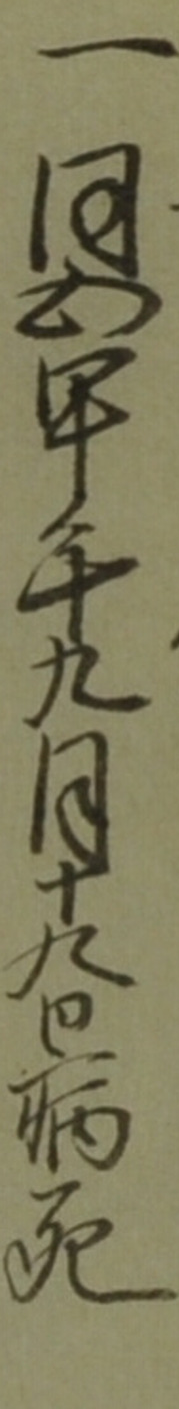一同五甲午九月十九日病死
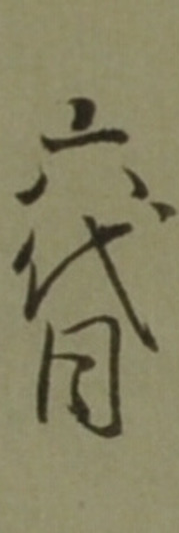六代目
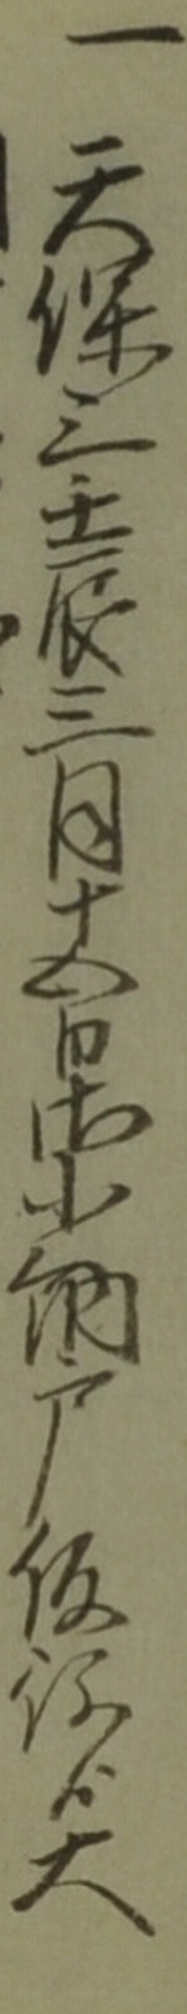一天保三壬辰三月十五日御小納戸仮役ゟ大
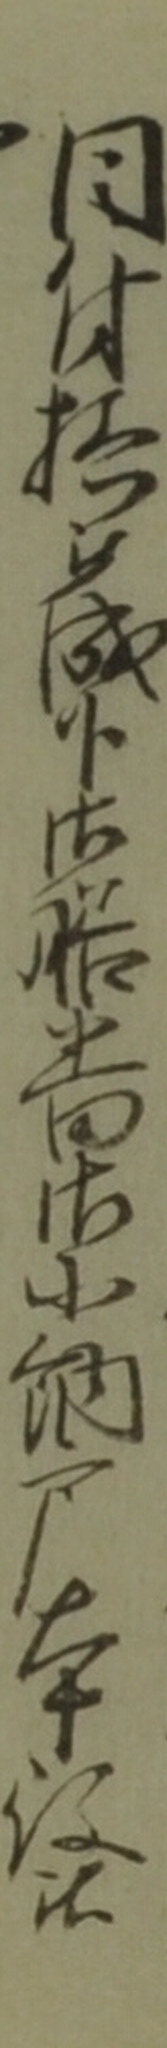目付格被成下御膳番御小納戸本役被
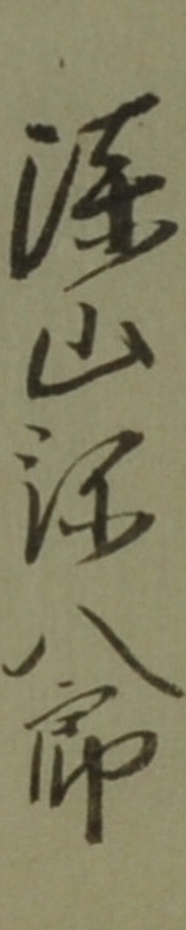漆山弥八郎
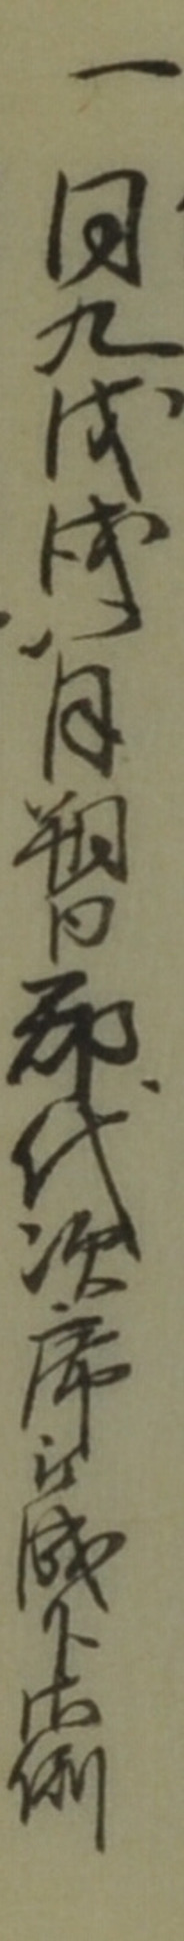一同九戊戌八月朔日郡代次席被成下御側
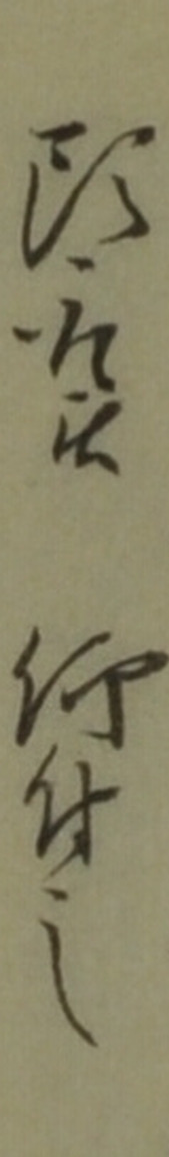頭取被仰付之
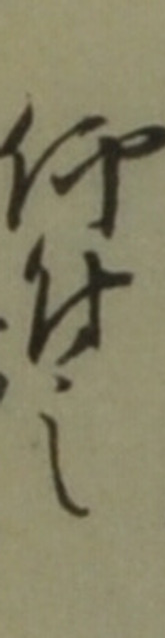仰付之
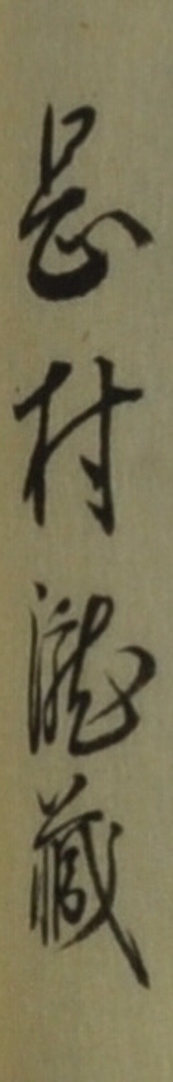岡村瀧蔵
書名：諸御役代々録（四）
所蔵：伊那市立高遠町図書館・合同会社AMANE
